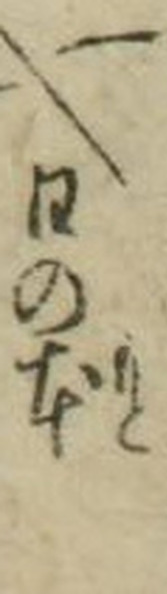日の本
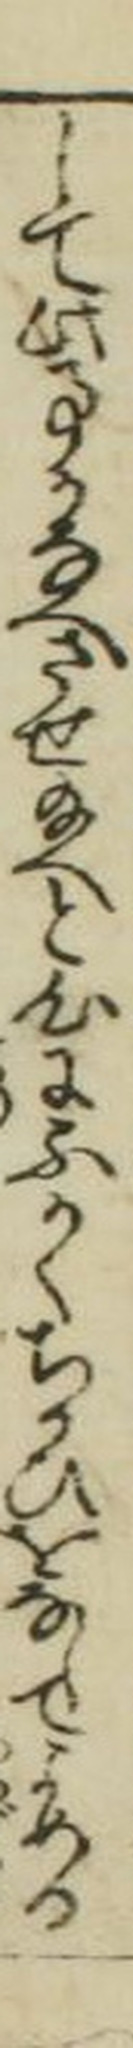して此事かなへさせ給へと心にふかくちかひをなしてよめる
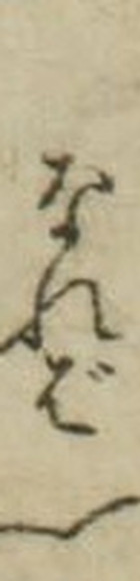なれば
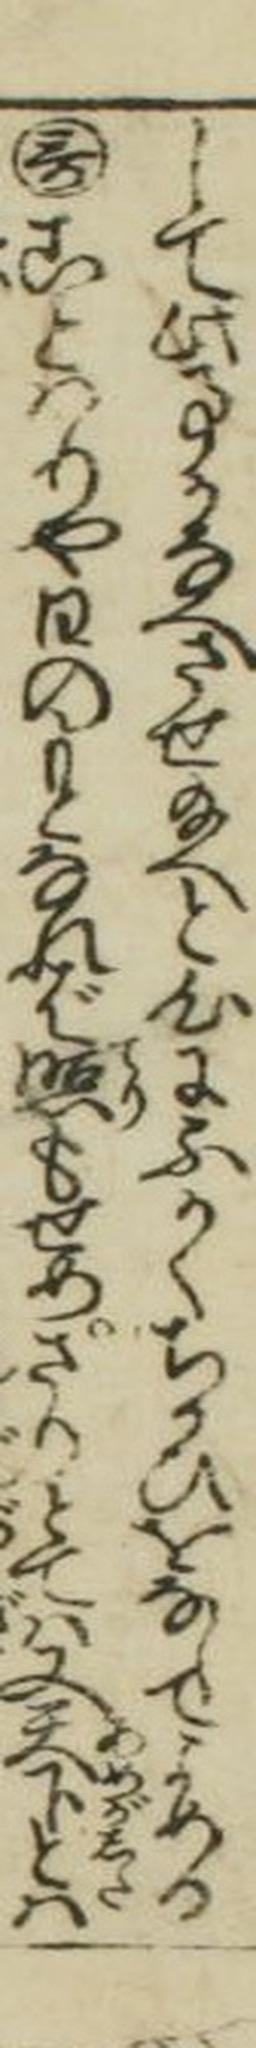哥ことはりや日のもとなれば照もせめ。さりとては又天下とは
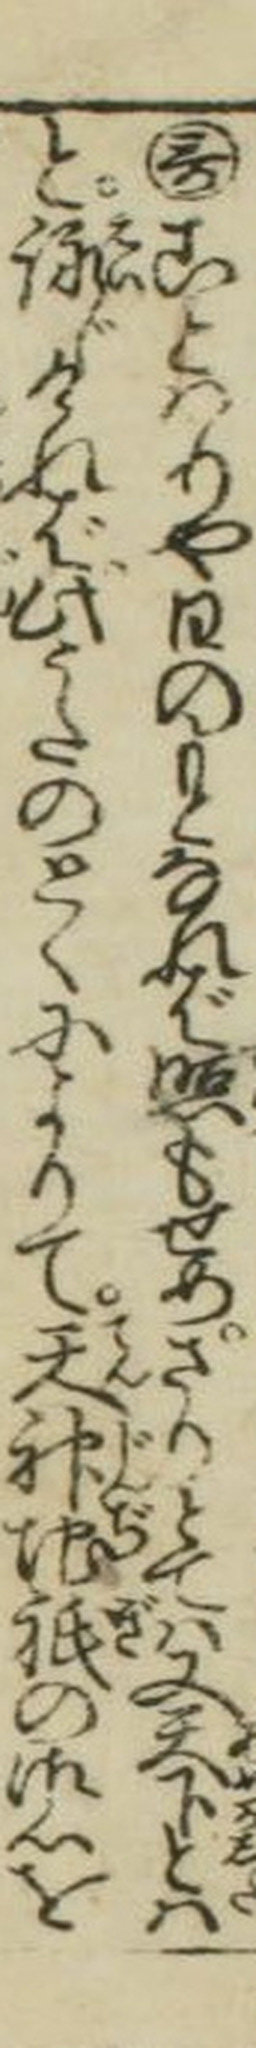と。詠じければ此うたのとくによりて。天神地祇の御心を
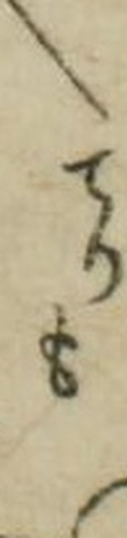てりも
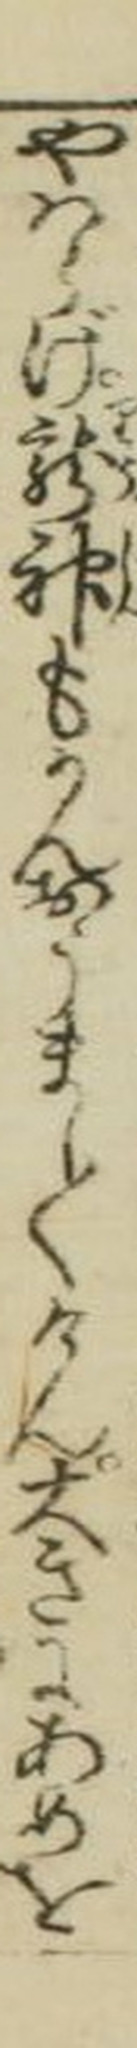やはらげ。龍神もかんおうまし〳〵けん。大きにあめを
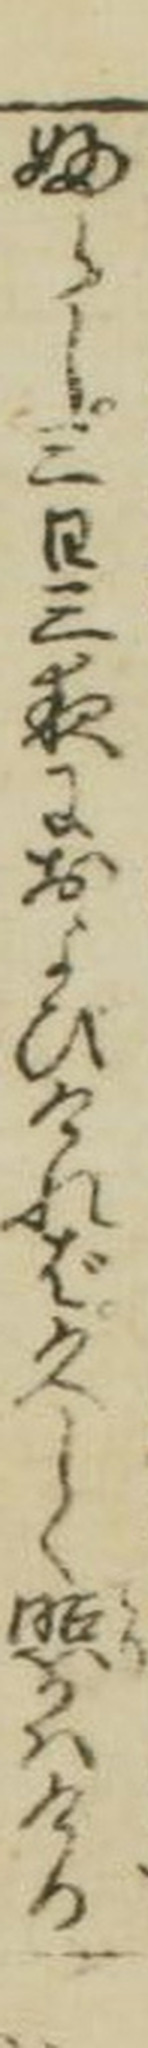ふらし。三日三夜におよびければ。久しく照かはける
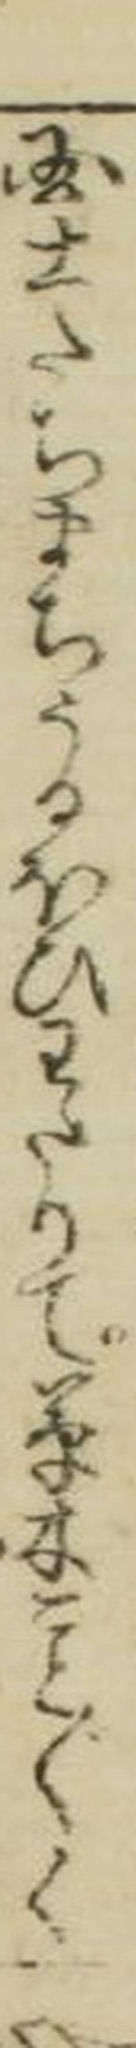国土たちまちうるほひわたりて。草木こと〴〵く
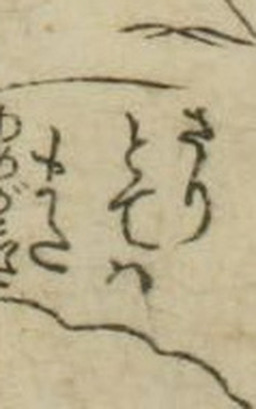とては
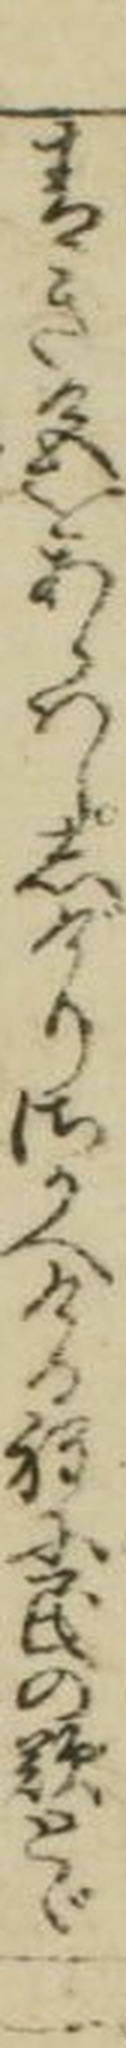青き色をあらはし。しげりさかへける程に民の歎とゞ
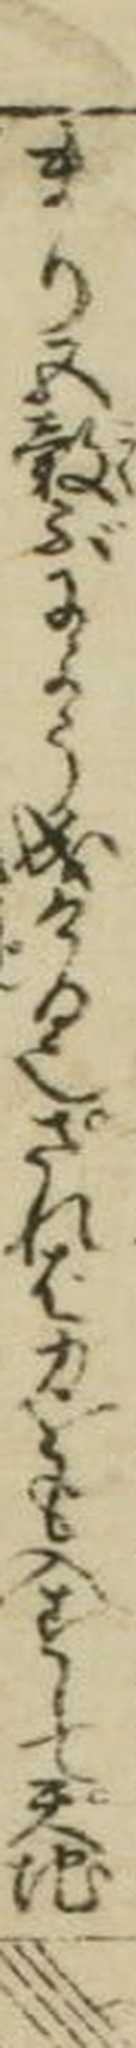まり五穀ぶによう成ける也。されば力をも入すして。天地
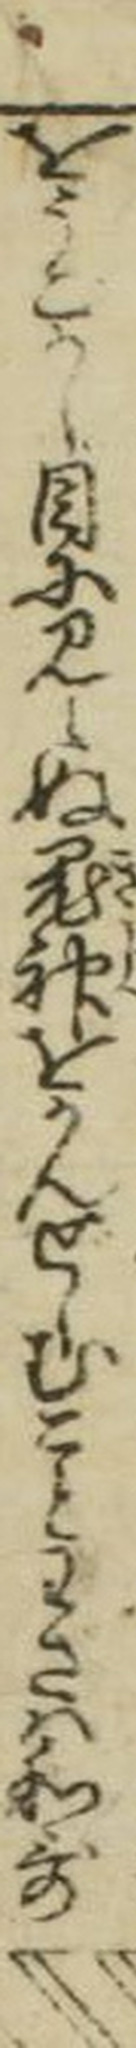をうごかし目に見えぬ鬼神をかんぜしむことわさは和哥
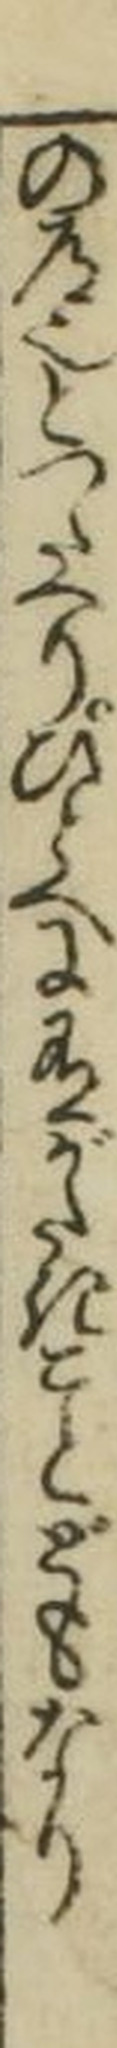の道也とつたへり。ひとへに有がたきことどもなり
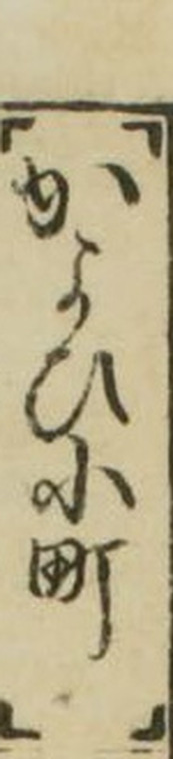雨ごひ小町

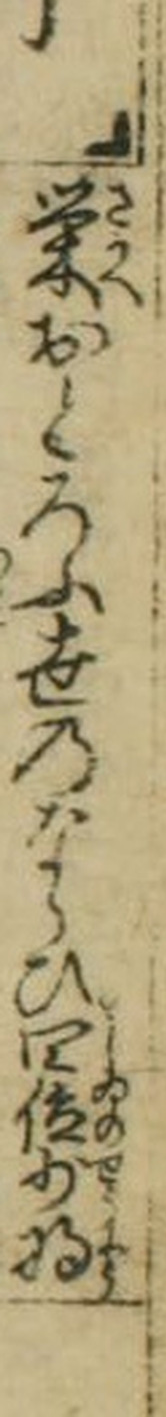栄おとろふ世のならひ四位少将
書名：女源氏教訓鑑
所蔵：東京学芸大学附属図書館
